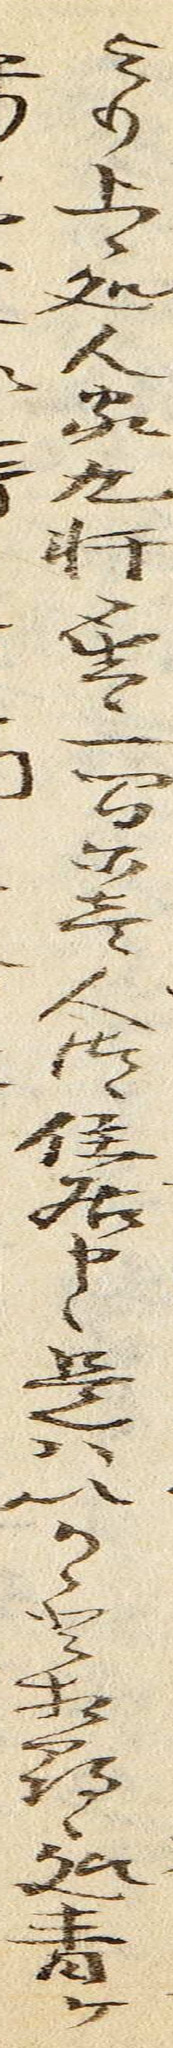より上候処人家九軒御座候一間に壱人つゝ住居申候是ハいかゝと相尋候処青ケ
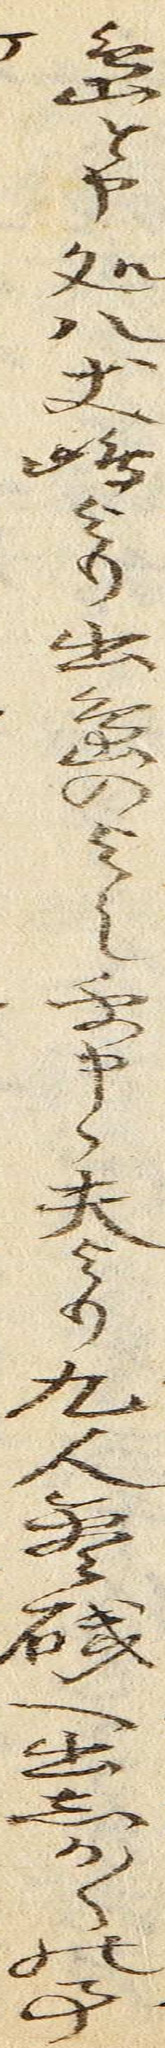島と申処八丈嶋より出島のよしを申候夫より九人参磯へ出しか〳〵の事
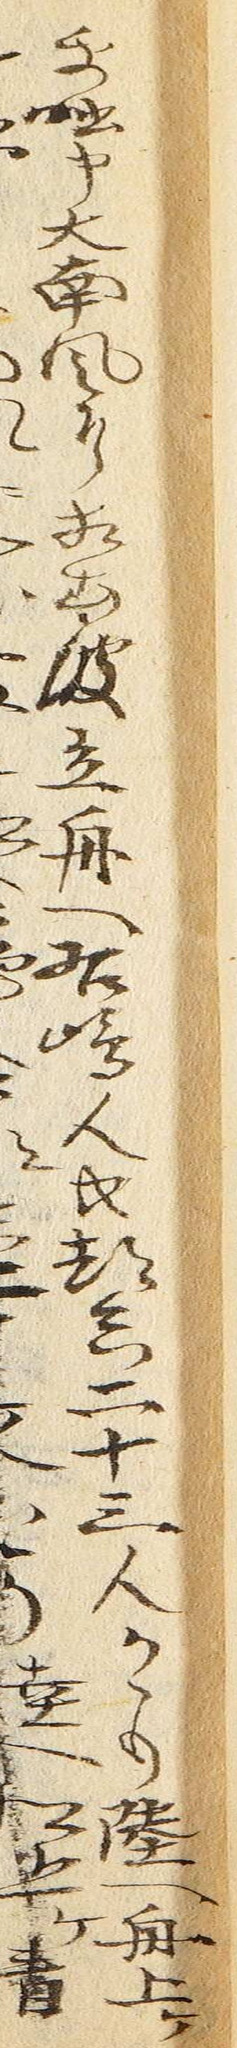を咄申大南風に相成波立舟へ右嶋人共都合二十三人かゝり陸へ舟上ケ
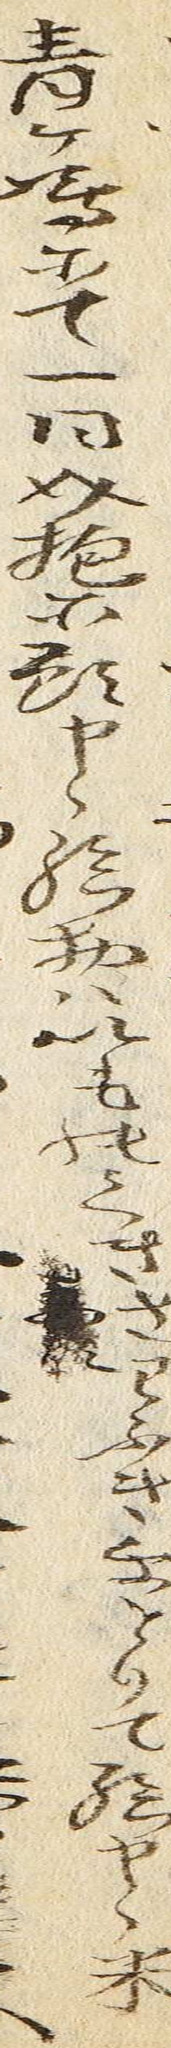青ケ嶋にて一同介抱に預申候給物ハいものくきさわふきをとりて給申候米
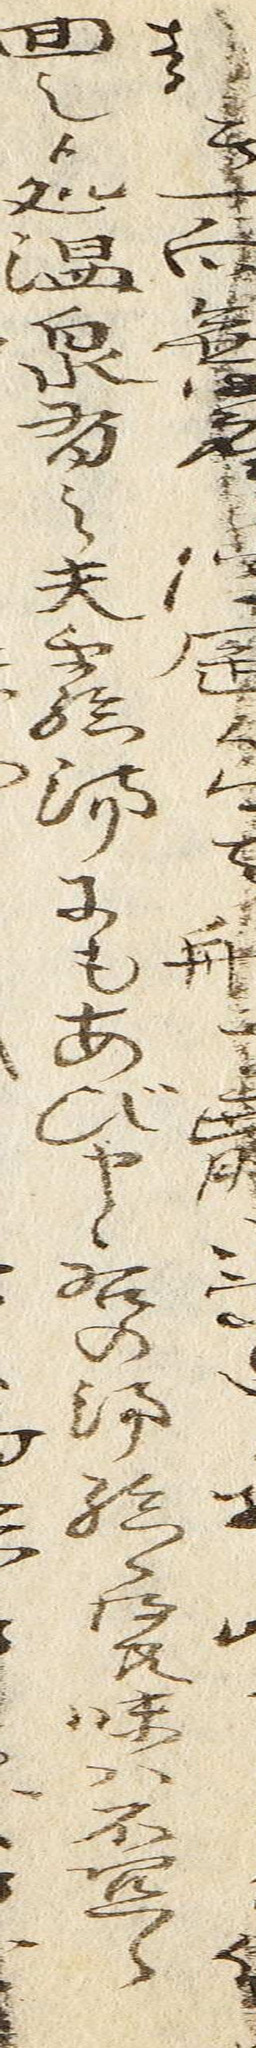回し候処温泉有之夫を給湯にもあび申候右の湯給候得共味ハ不宜候
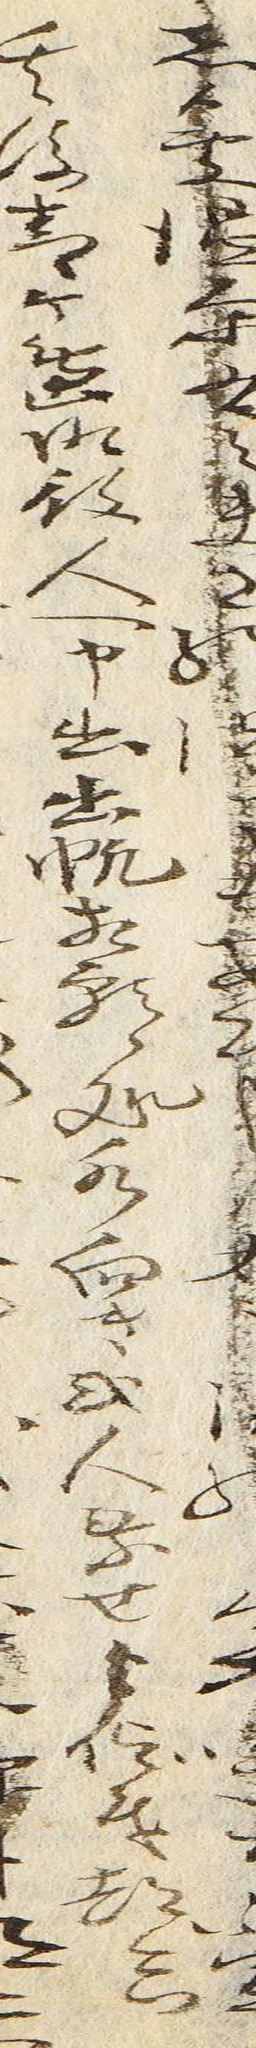其後青ケ嶋御役人へ申出出帆相願候処水向き弐人乗せ被仰付都合
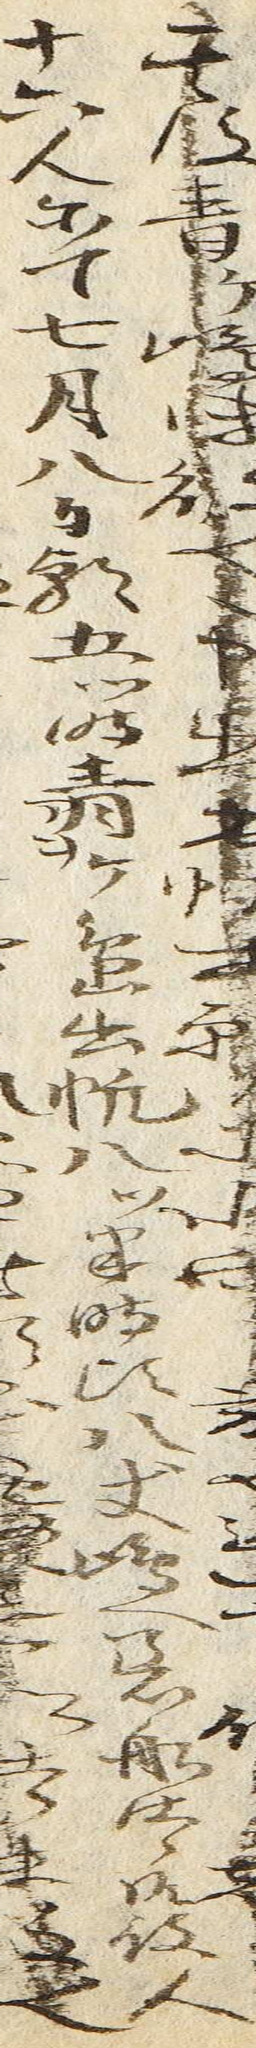十六人にて七月八日朝五ツ時青ケ島出帆八ツ半時頃八丈嶋へ着船仕候御役人
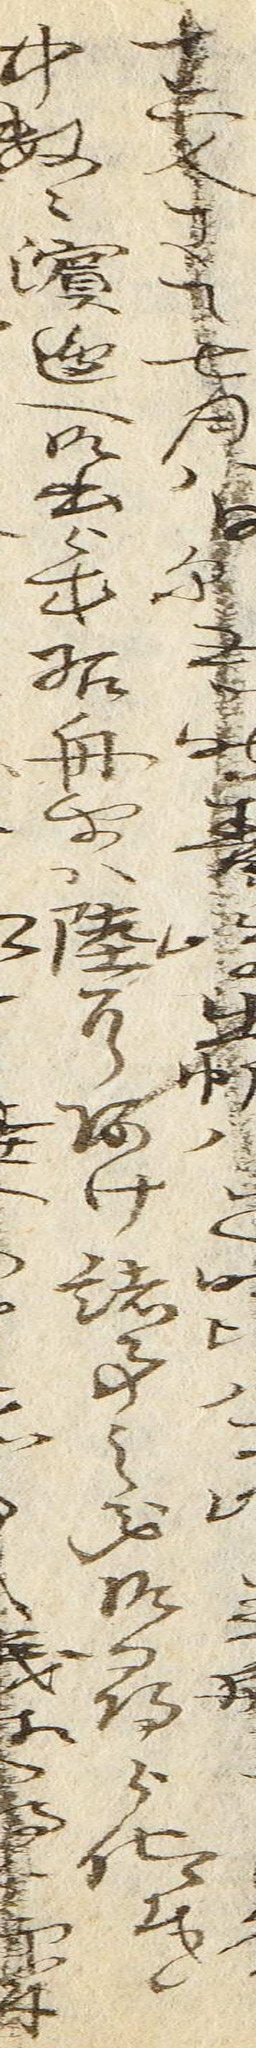中数々浜辺へ御出被成右舟をハ陸にあけ諸事之義御尋被仰付候
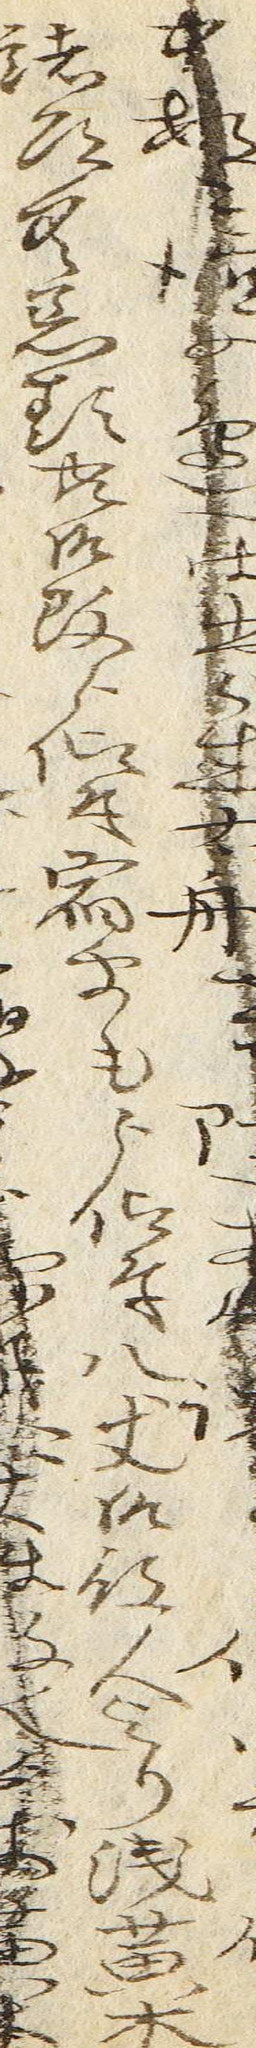諸道具着類共御改被仰付宿をも被仰付八丈御役人より浅黄木
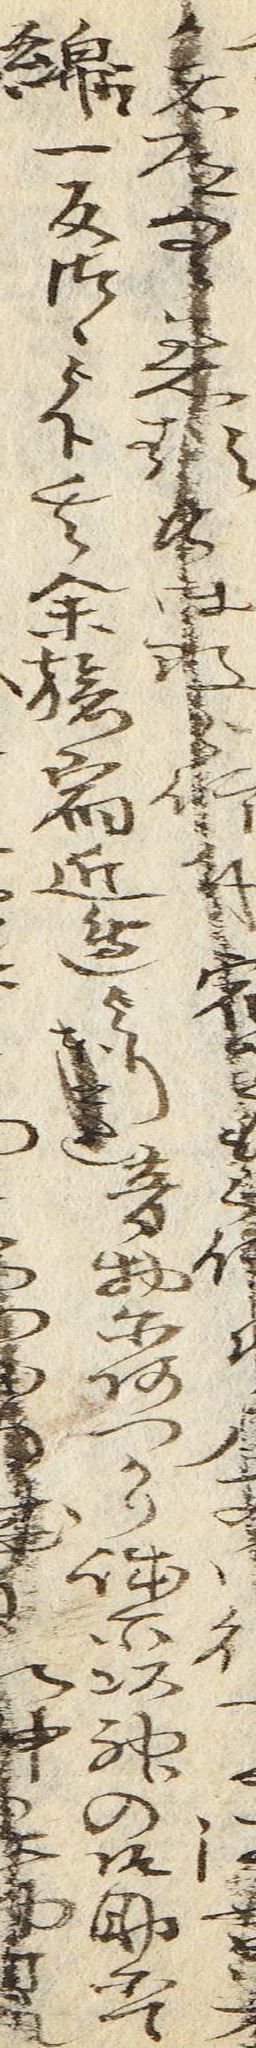綿一反つゝ被下其余旅宿近辺より音物にあつかり誠に以神の御助にて
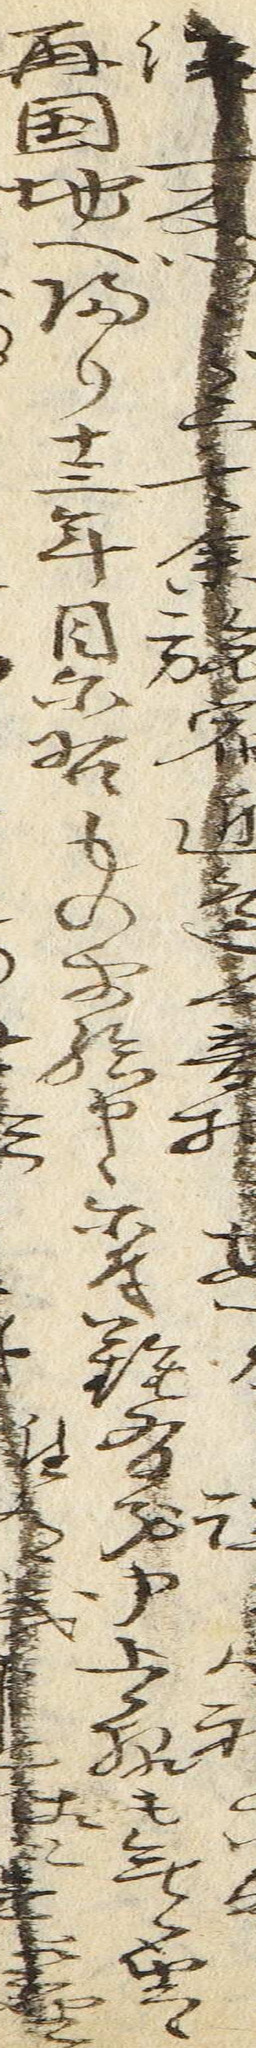再国地へ帰り十三年目に右ものを給申候に付難有義申上候様も無御座候
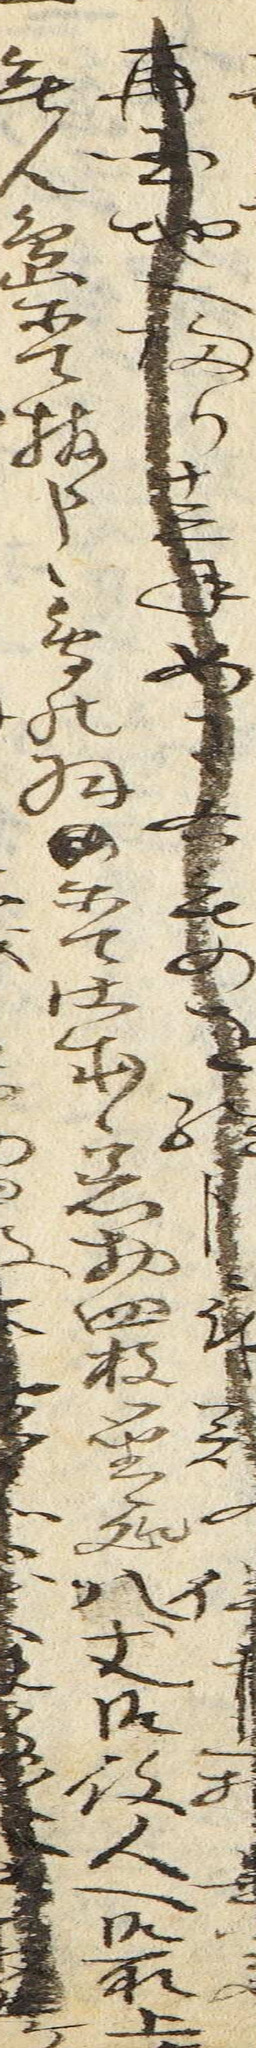一無人島にて拵申候鳥の羽にて仕成候着物四枚御座候処八丈御役人へ御取上ケ

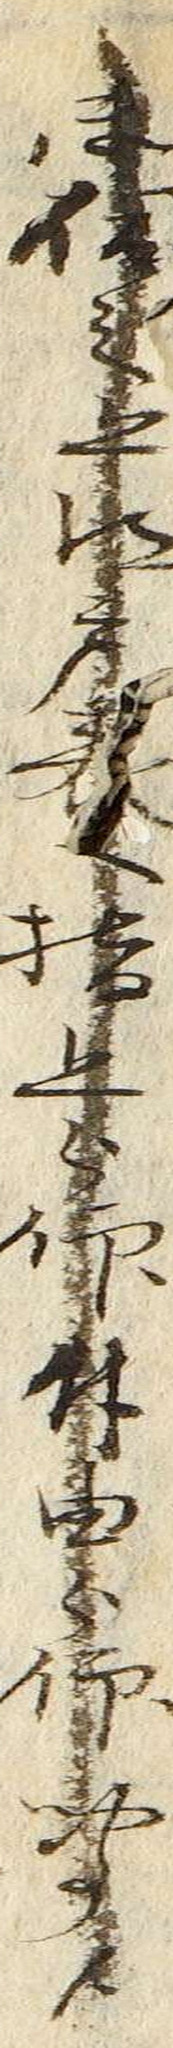御伺之上江戸表へ差上被仰付候由被仰聞候
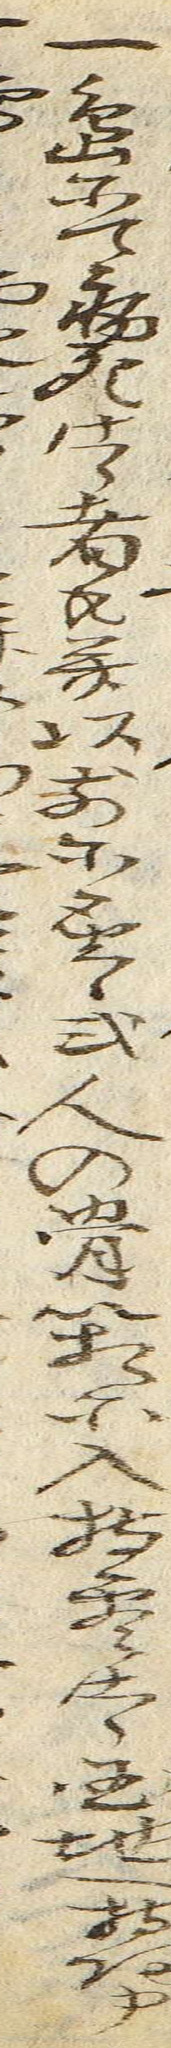一島にて病死仕候者共并以前に御座候弐人の骨箱に入持参仕候国地へ持帰申
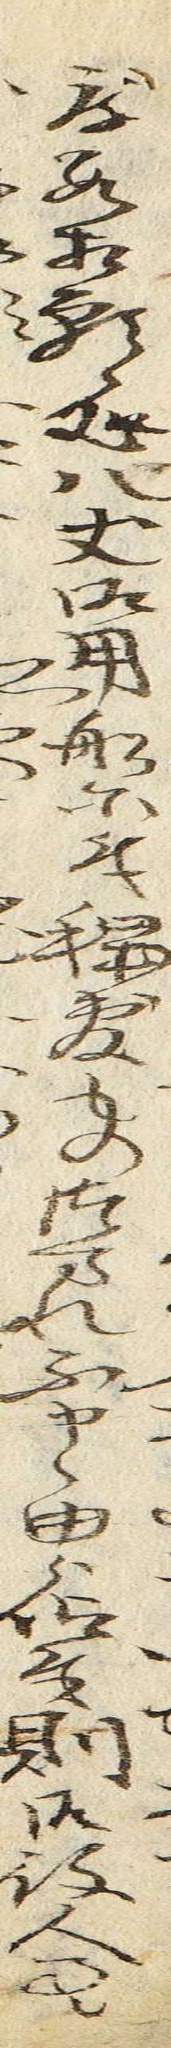度段相願候処八丈御用船に付穢敷ものつまれ不申候由被仰付則御役人差
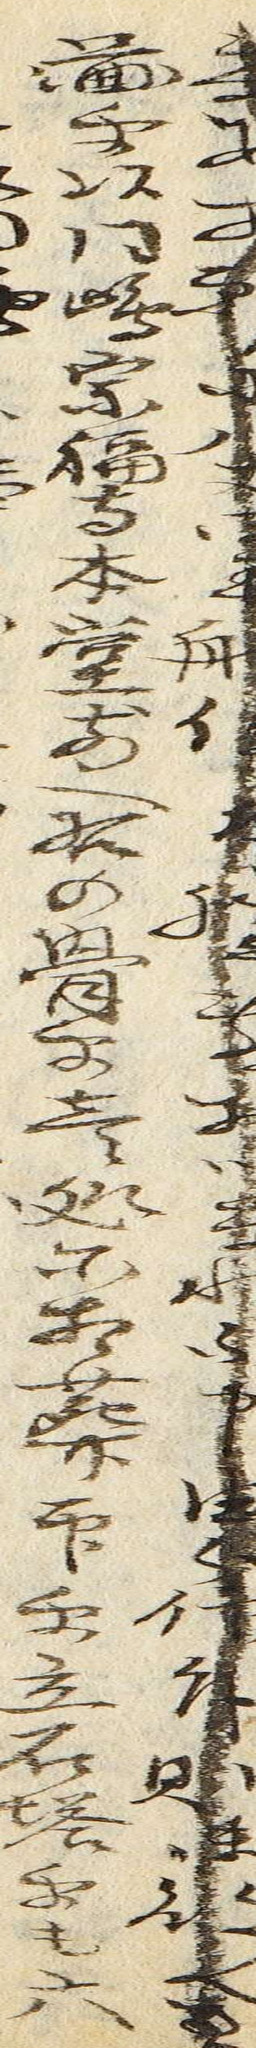図を以同嶋宗福寺本堂前へ右の骨を壱処に相葬印を立石塔をも六
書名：無人島漂流書付
